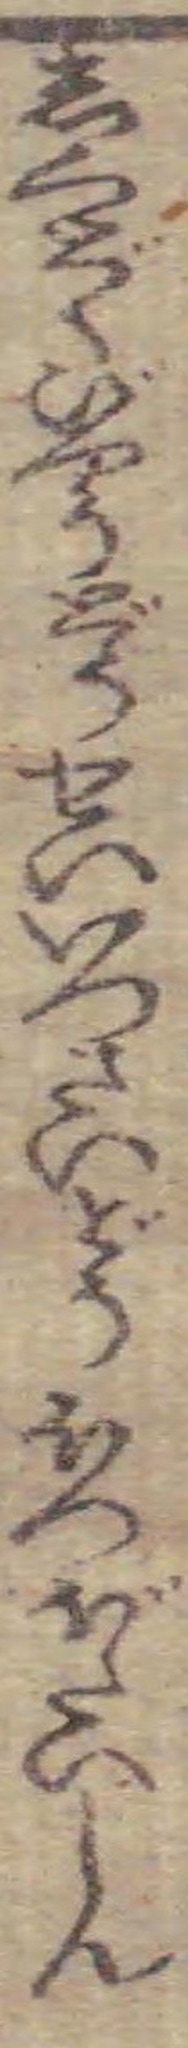しくどくびやうどうせいいつさいどうほつぼたいしん

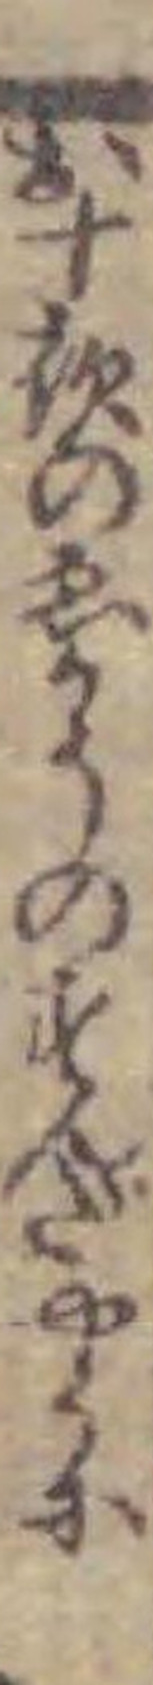お十夜のゑかうのすんだやうに
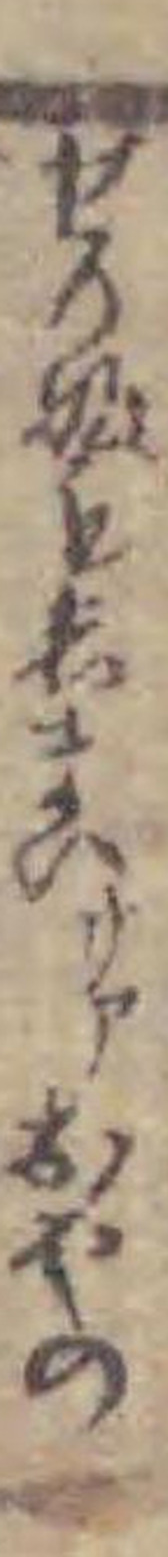せりふもしまい
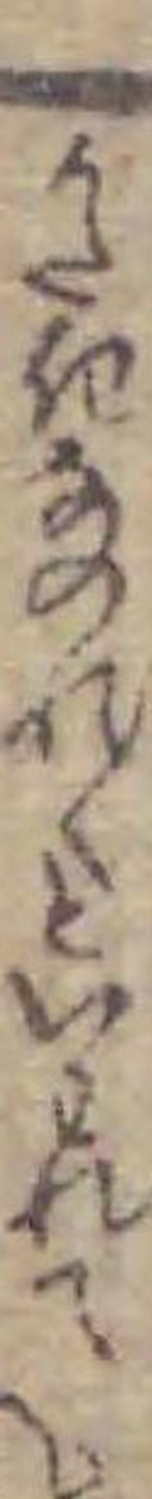かたきなのれ〳〵といわれて
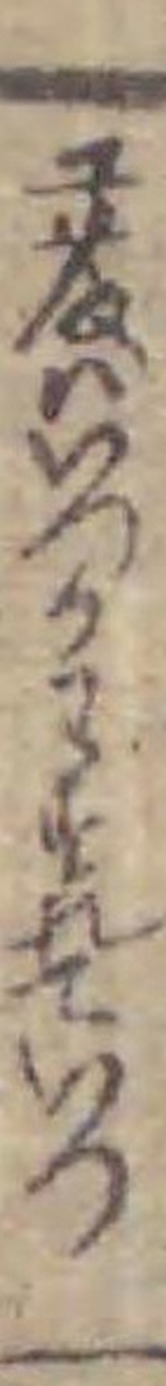工藤はいつかわすれていつ
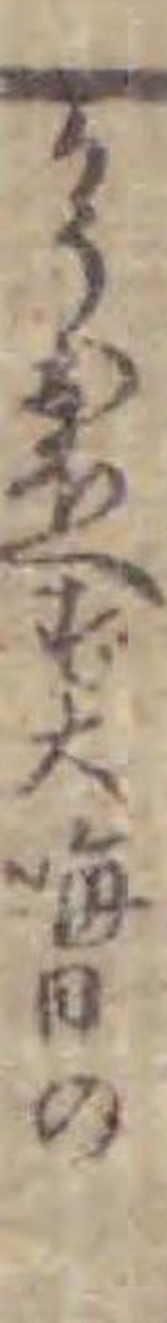かうおほへず大晦日の
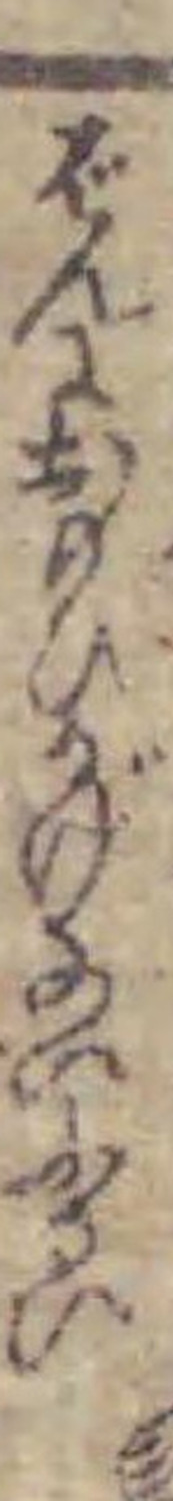ばんにおもひがけにいふるい
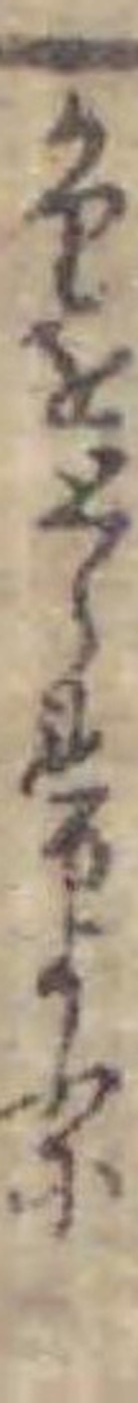かりをとられるよふに
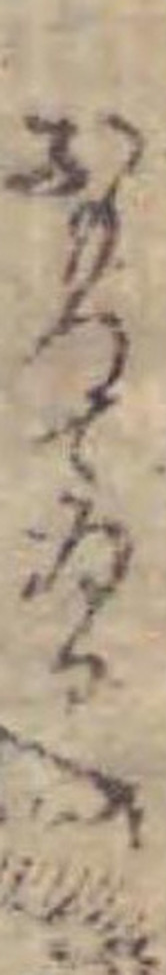おもつてゐる
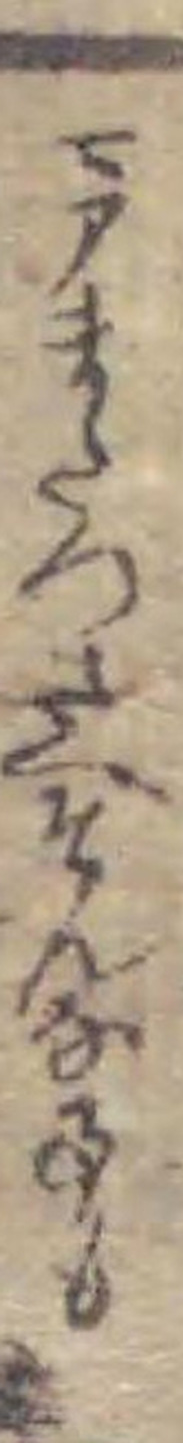マアまたつたへそんな事も
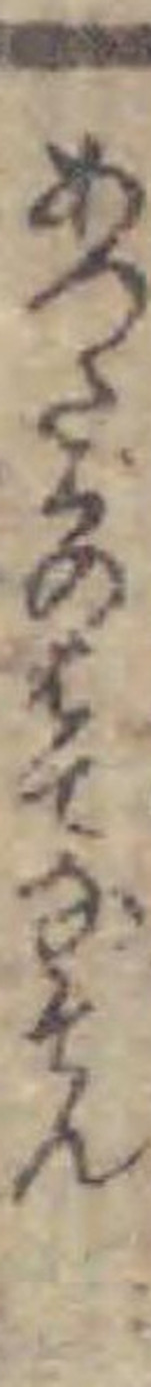あつたかのはてなそん
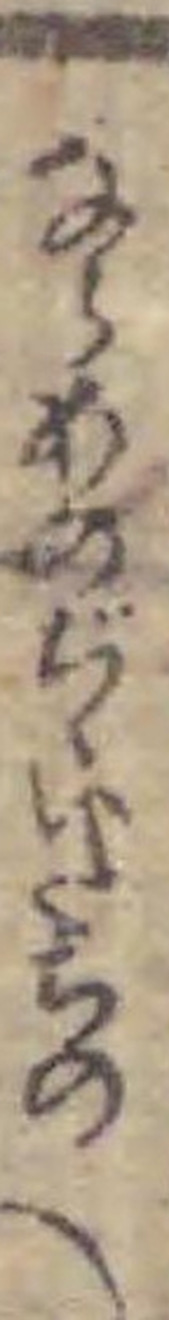ならあのぢゝいたちの
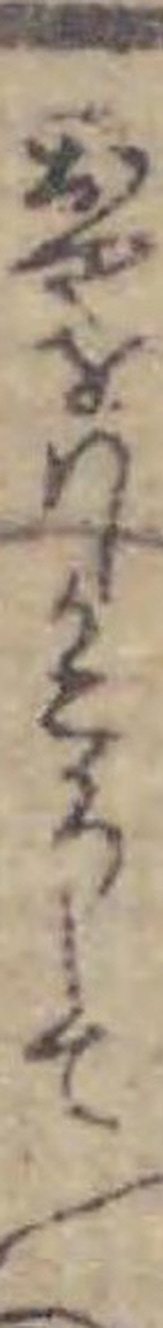おやをわしかころして
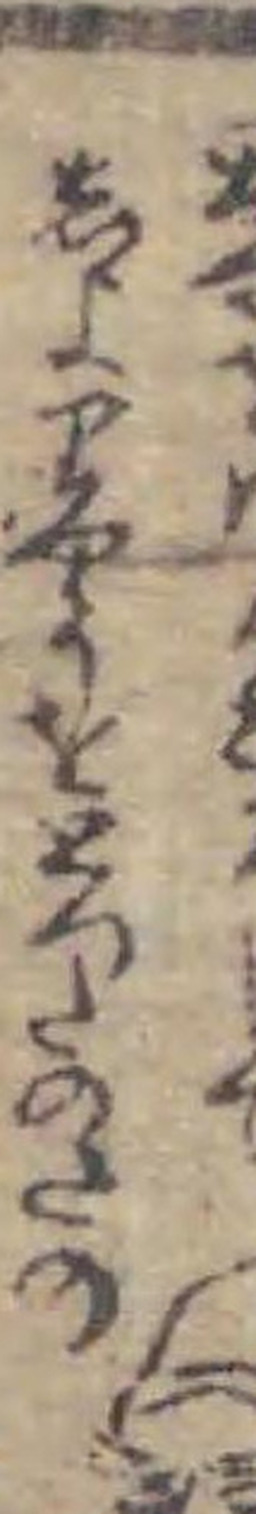しよりやうをとつたのたの
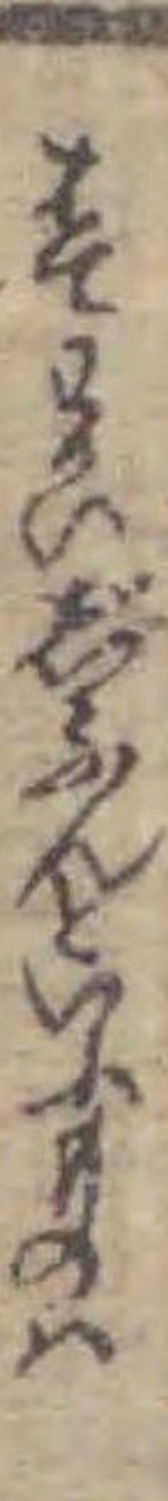はてわかいじふんといふものは
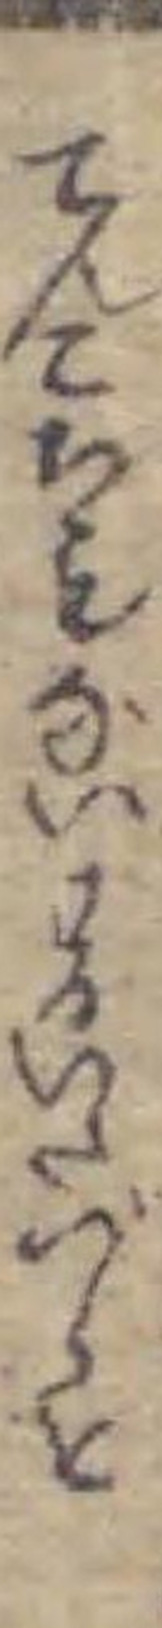てんこちもないわるいたづらを
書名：年寄之冷水曽我 : 3巻
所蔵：国立国会図書館 National Diet Library, JAPAN
